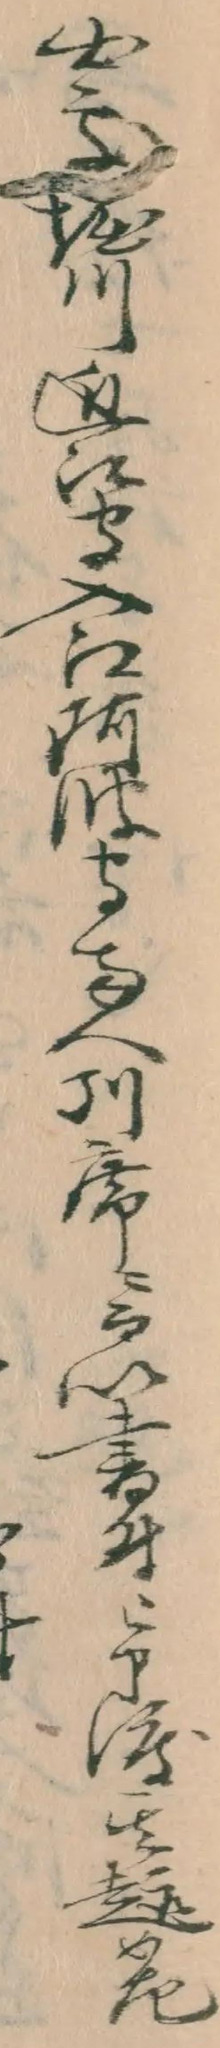出處堀川近江守入江阿波守両人列席ニ而以書付被申渡其趣如左
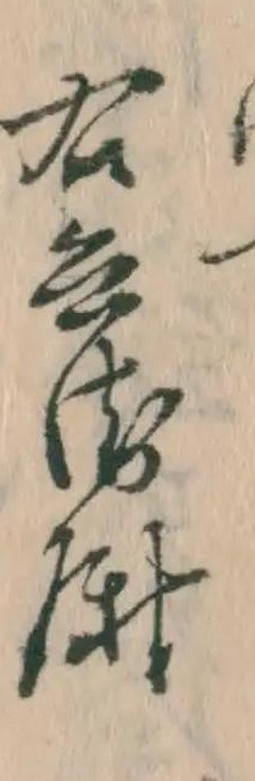右兵衛尉
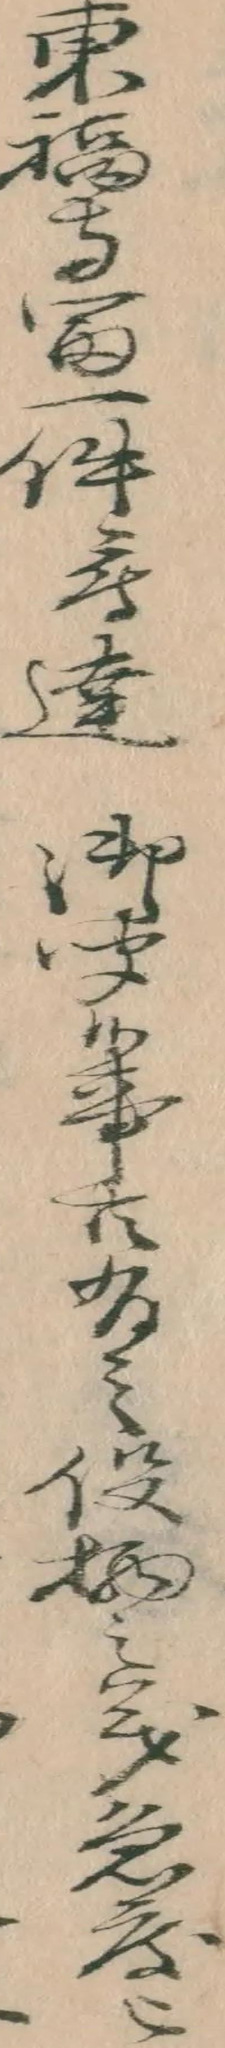東福寺冨一件ニ付達御聞候事共有之役柄之義急度被
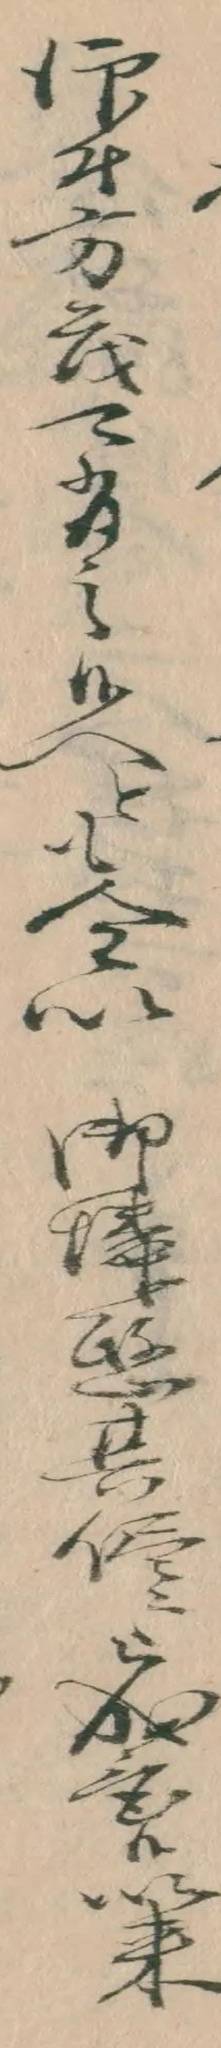仰付方も可有之候へとも今以御憐愍其侭二被成置候以来
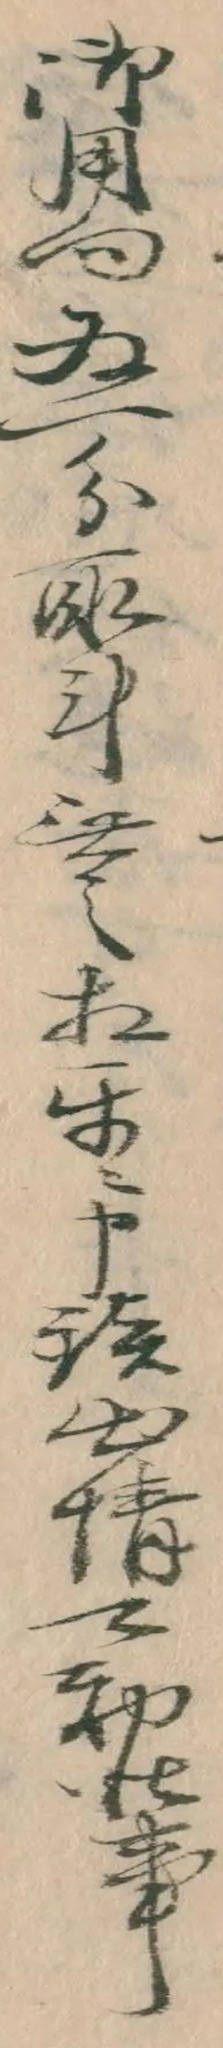御用向為一分取斗無之相互ニ申談出情可勤仕事
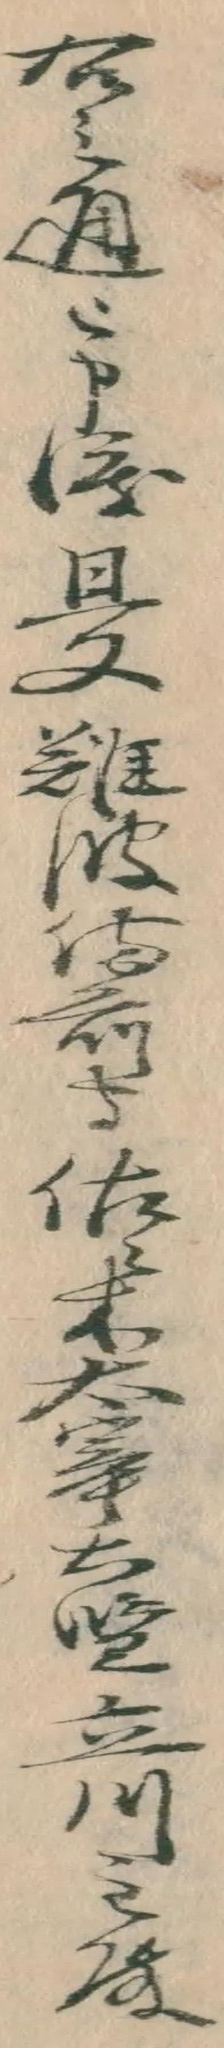右之通被申渡且又難波備前守佐々木大宰大監立川主殿
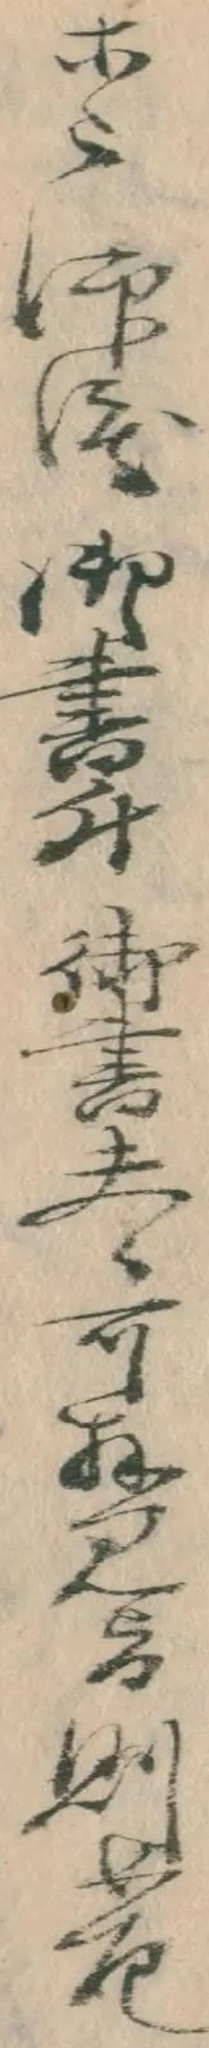等被仰渡御書付御書夫々可相見旨則如左
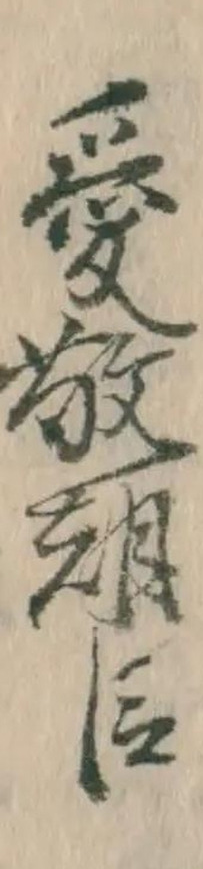愛敬朝臣
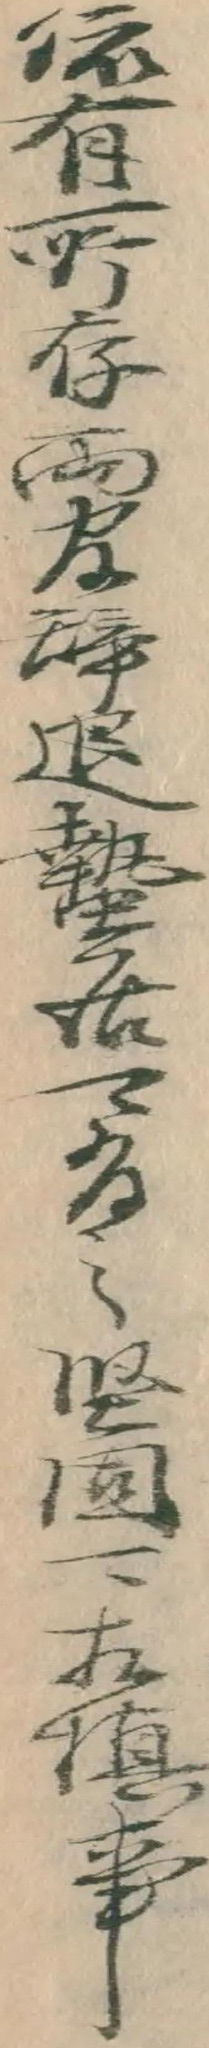依有所存両官辞退蟄居可有之堅固可相慎事

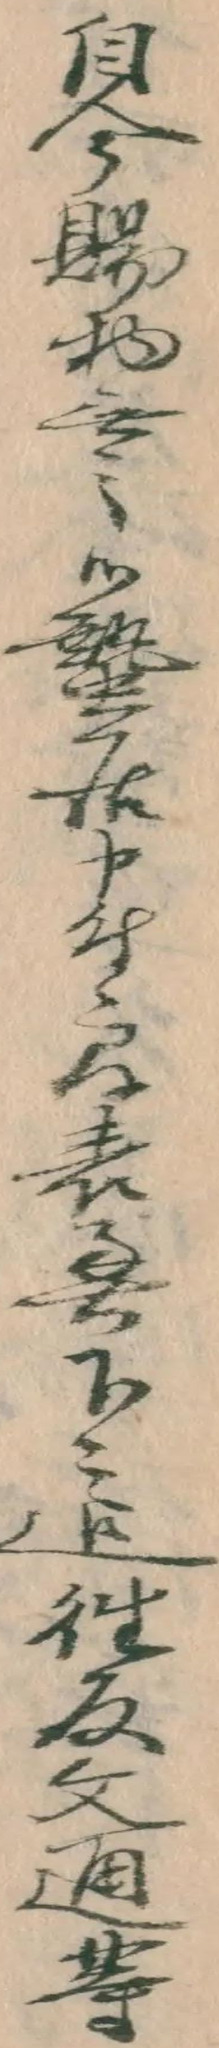自今賜物無之候蟄居申付候間表奥下之迄往反文通等
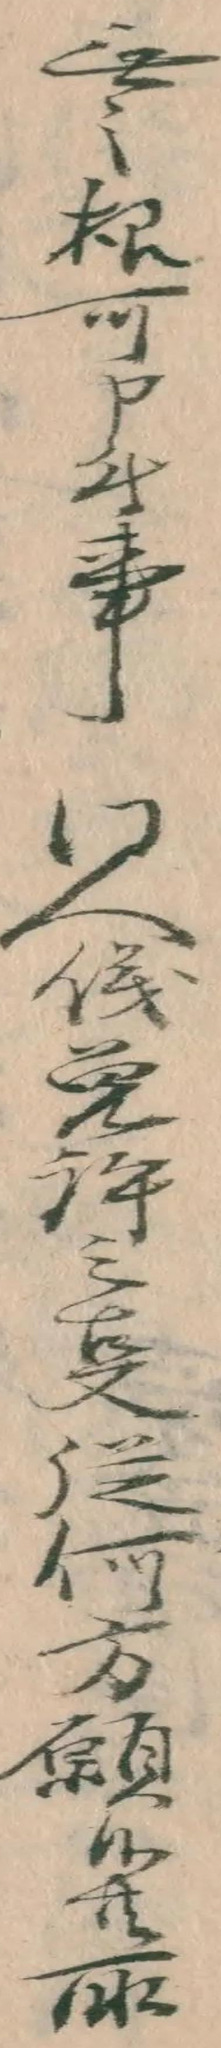無之様可申付事同人儀免許之事従何方願候共取
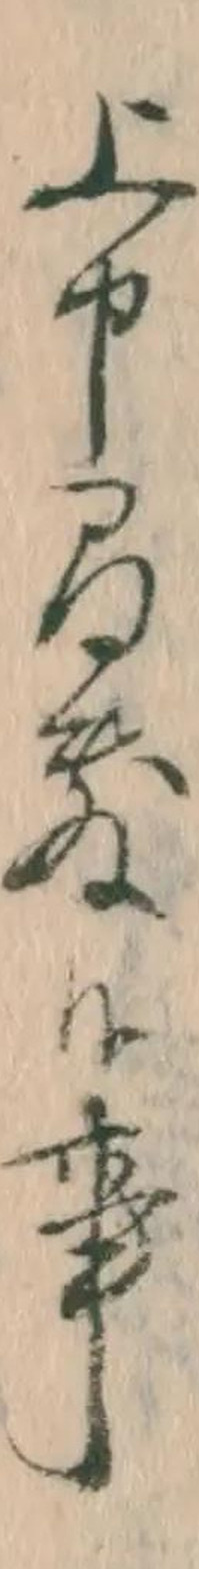上申間敷候事
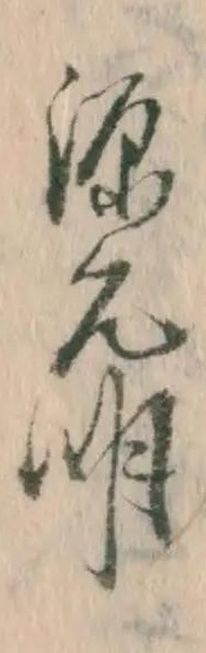源元明
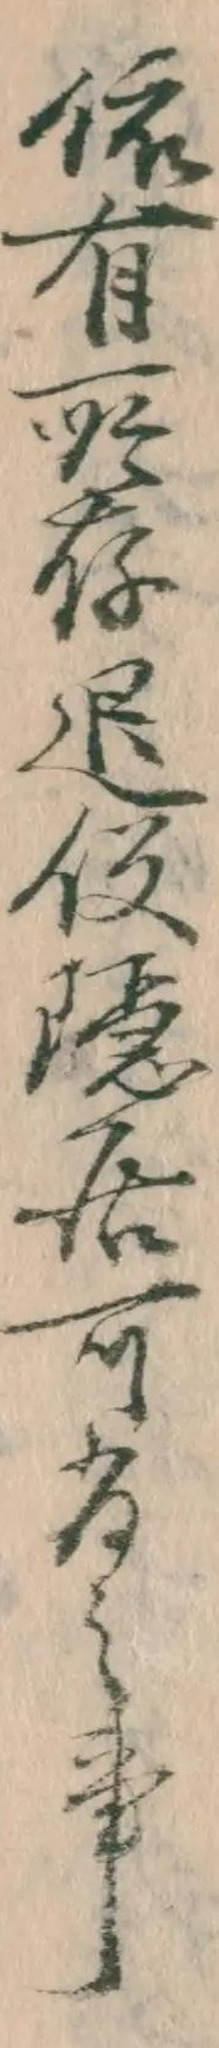依有所存退役隠居可有之事
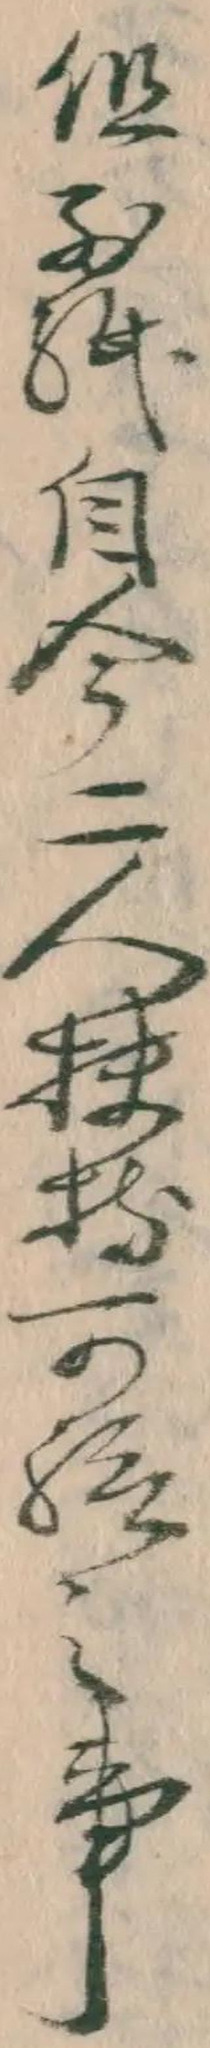但別紙自今二人扶持可給之事
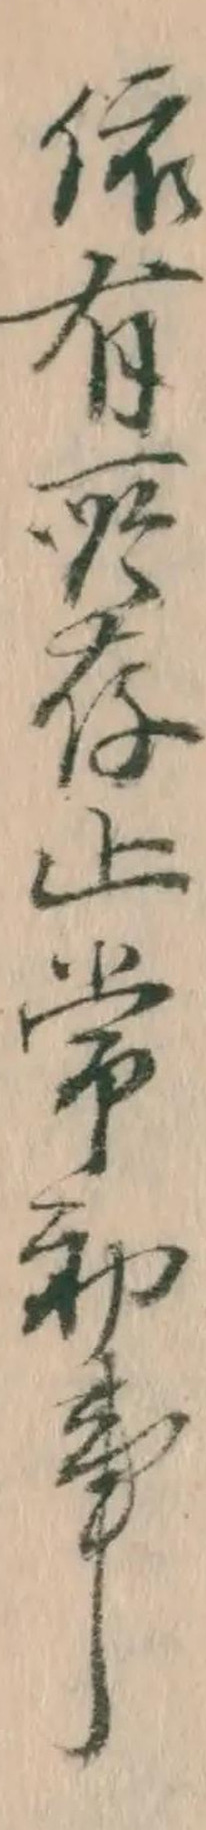依有所存止常初事
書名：賀茂社記録. 第65冊
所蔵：国立国会図書館 National Diet Library, JAPAN
